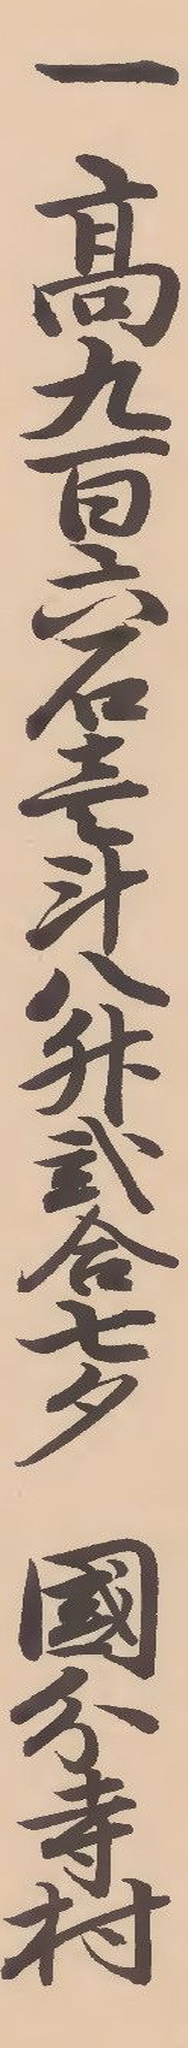一高九百六石壱斗八升弐合七勺国分寺村
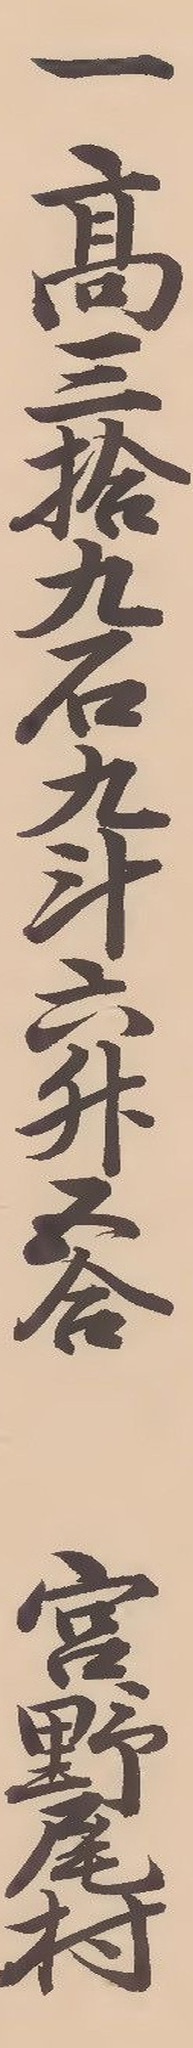一高三拾九石九斗六升五合宮野尾村
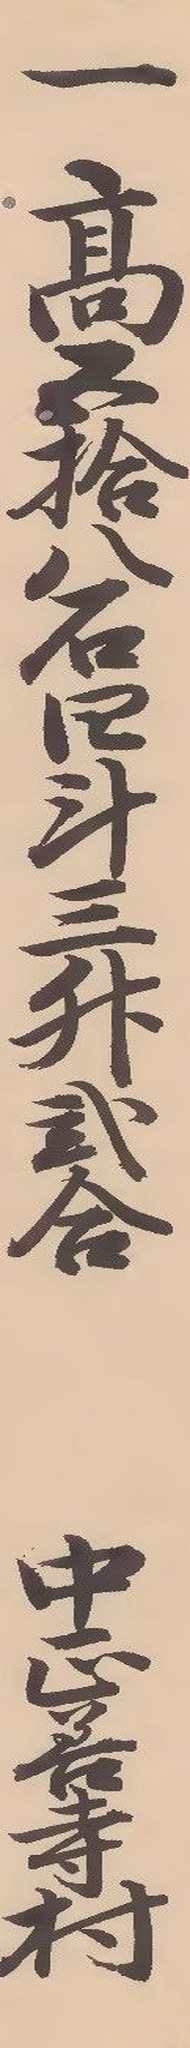一高五拾八石四斗三升弐合中正善寺村
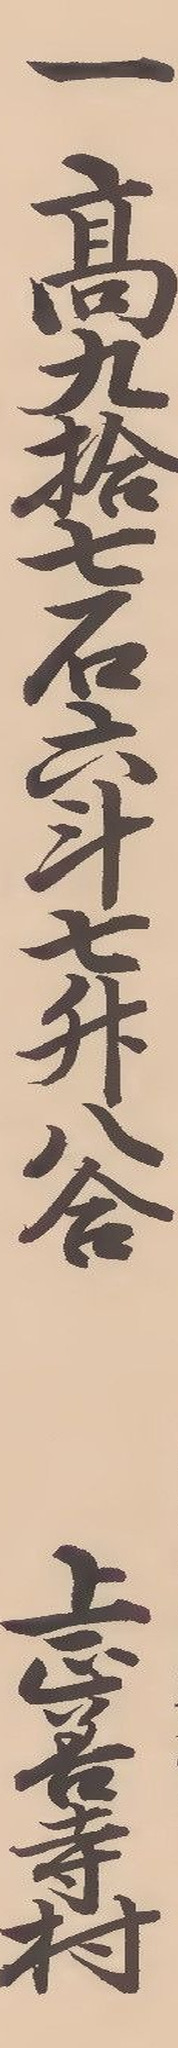一高九拾七石六斗七升八合上正善寺村
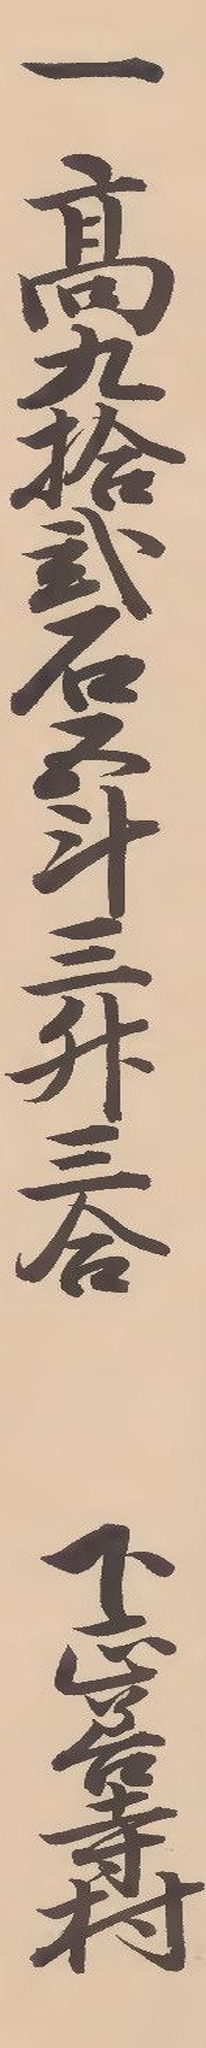一高九拾弐石五斗三升三合下正善寺村
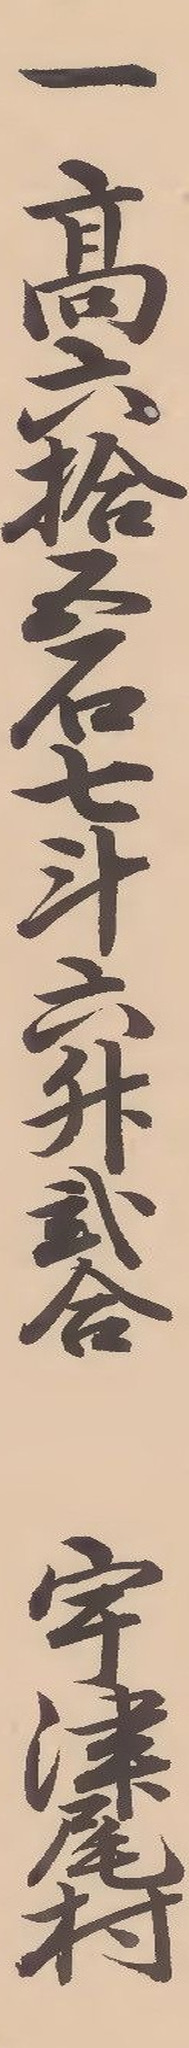一高六拾五石七斗六升弐合宇津尾村
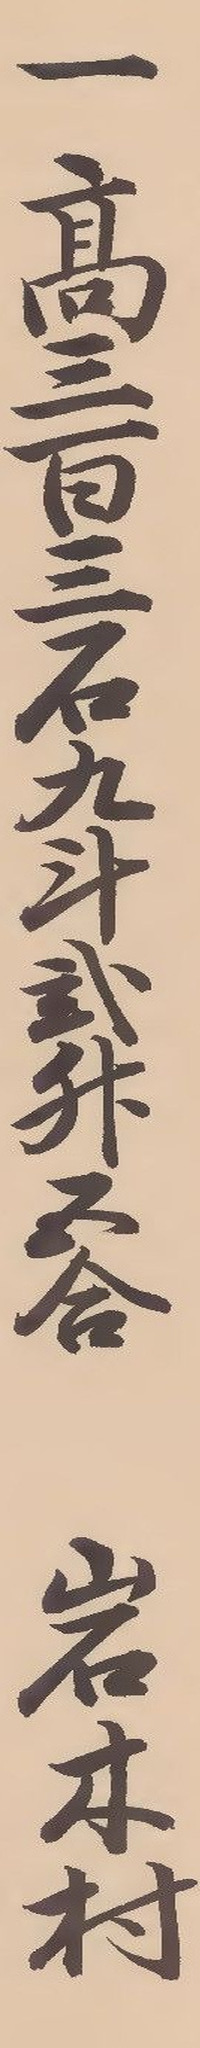一高三百三石九斗弐升五合岩木村
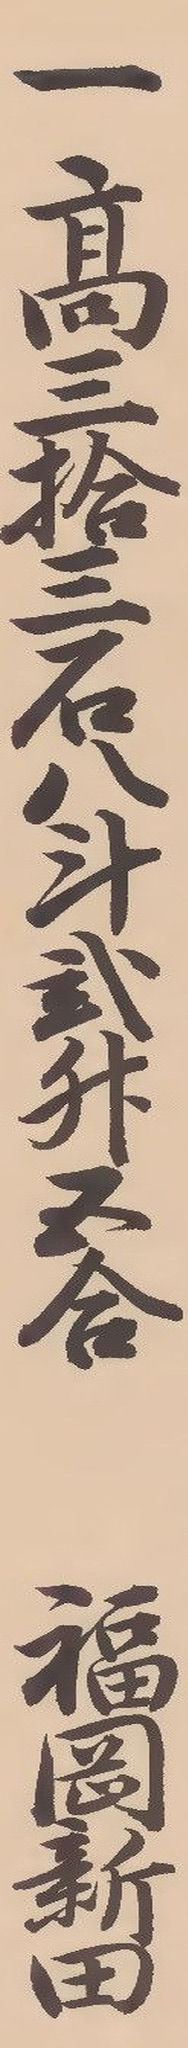一高三拾三石八斗弐升五合福岡新田

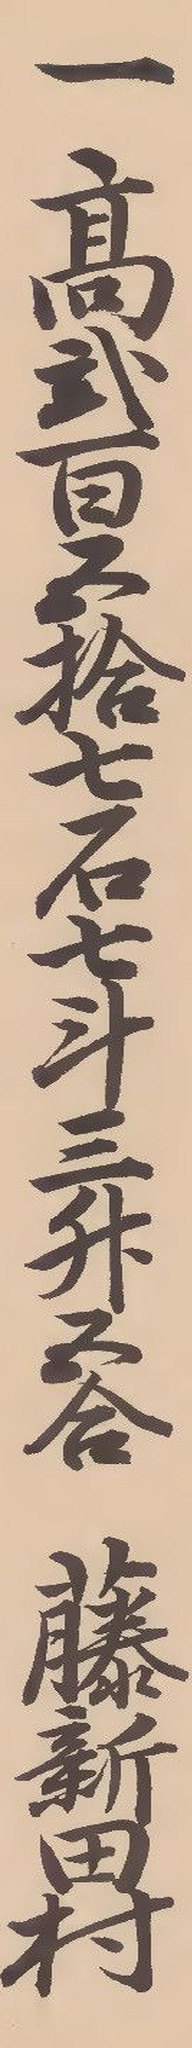一高弐百五拾七石七斗三升五合藤新田村
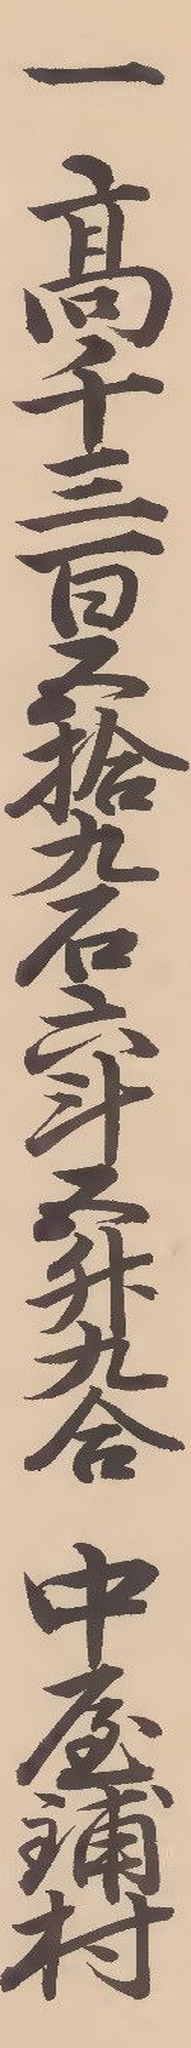一高千三百五拾九石六斗五升九合中屋鋪村
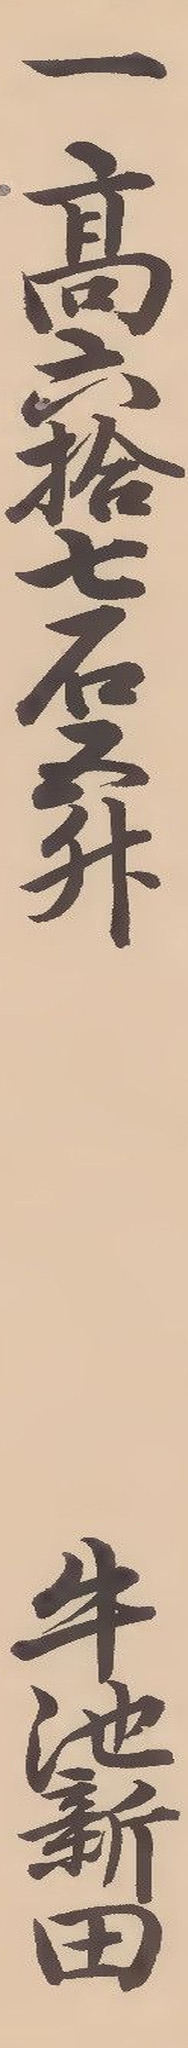一高六拾七石五升牛池新田
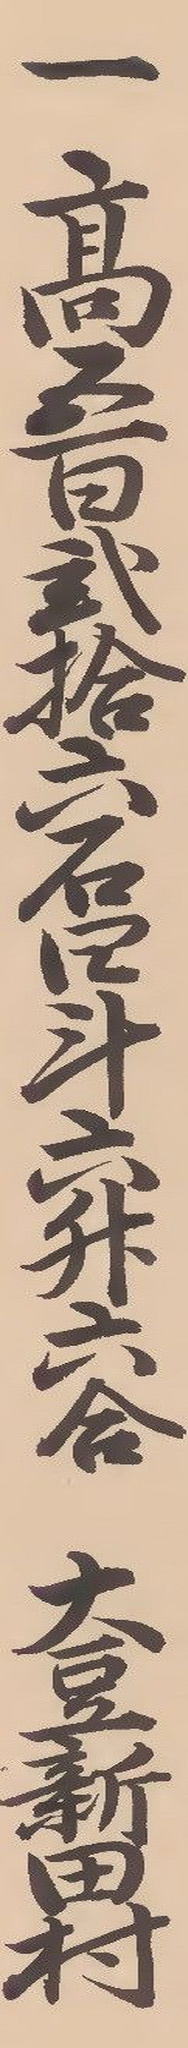一高五百弐拾六石四斗六升六合大豆新田村
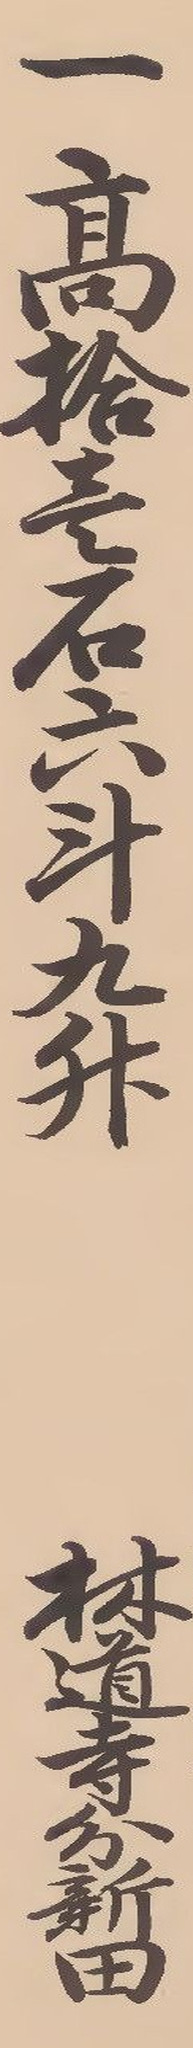一高拾壱石六斗九升林道寺分新田
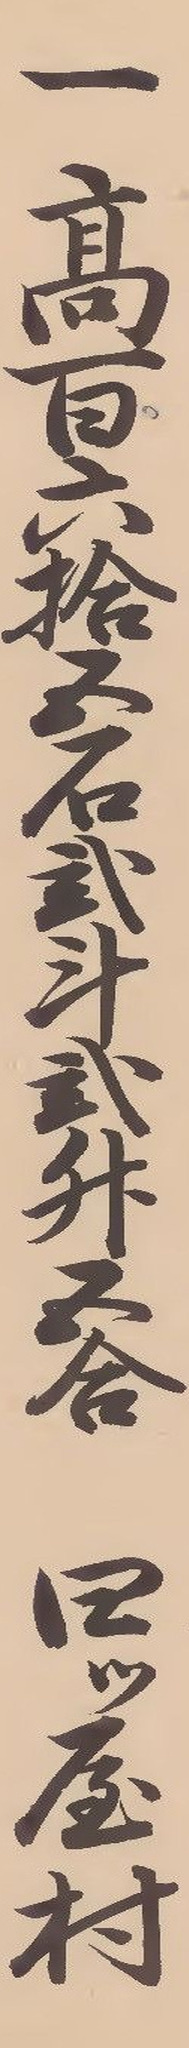一高百六拾五石弐斗弐升五合四ツ屋村
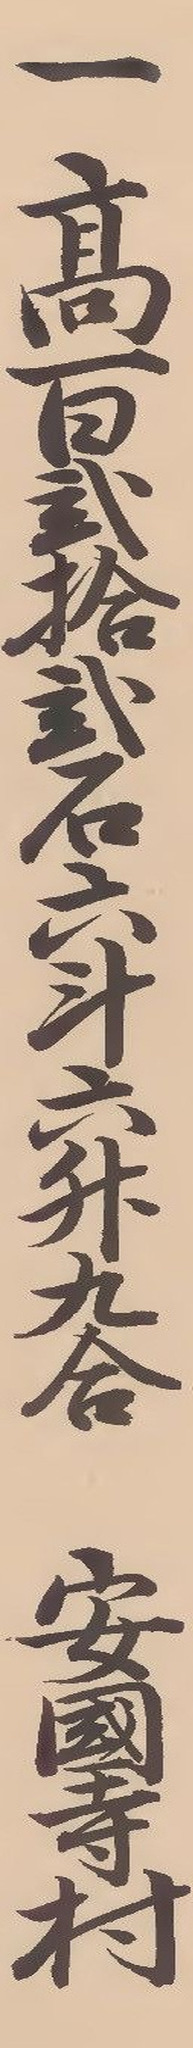一高百弐拾弐石六斗六升九合安国寺村

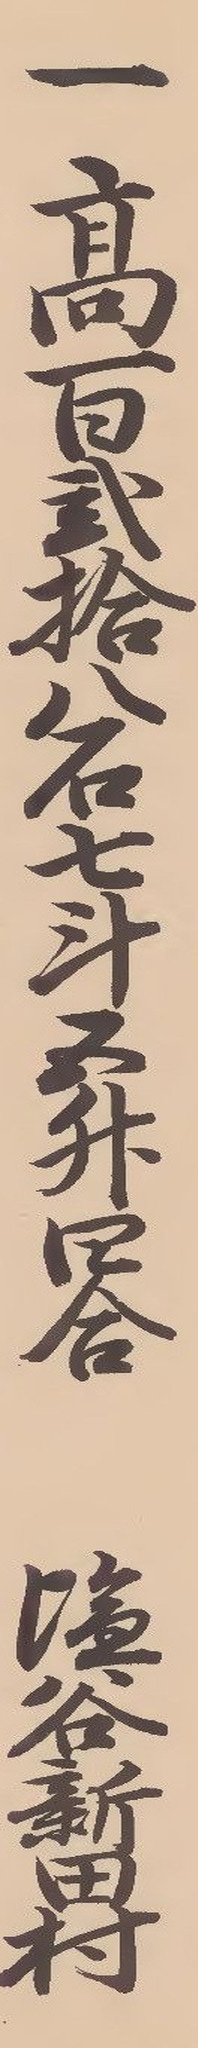一高百弐拾八石七斗五升四合塩谷新田村
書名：越後国郷帳　上
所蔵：国立公文書館 National Archives of Japan
